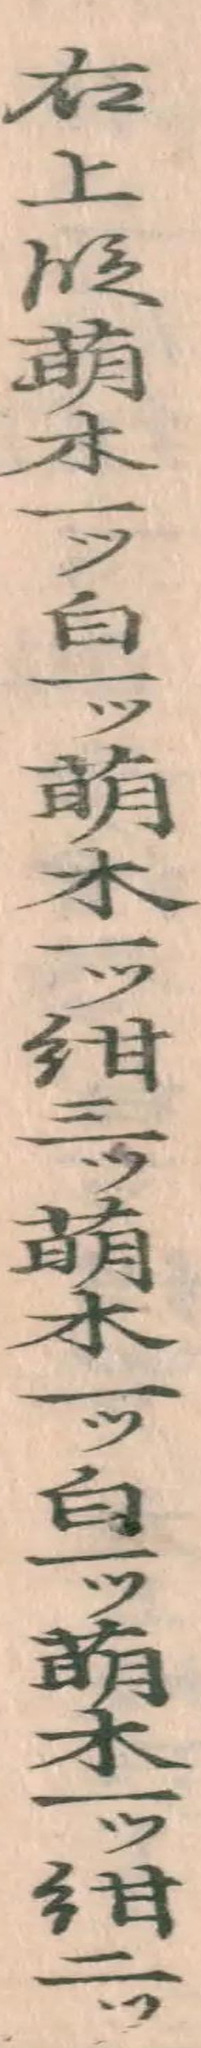右上段萌木一ッ白一ッ萌木一ッ紺三ッ萌木一ッ白一ッ萌木一ッ紺二ッ
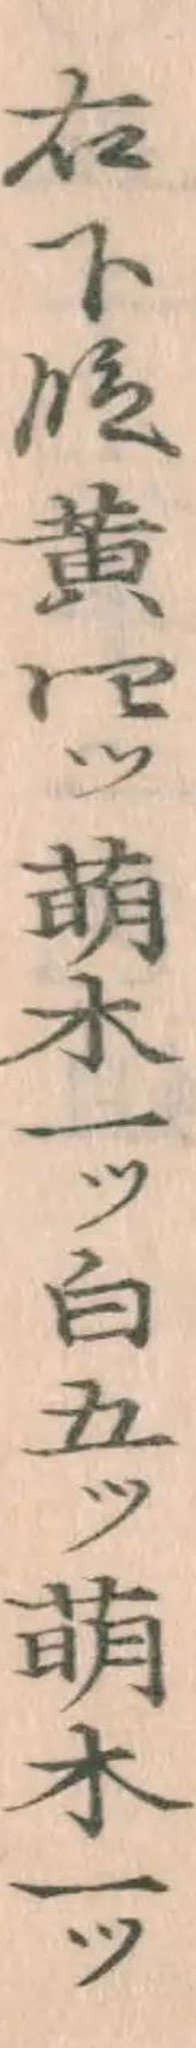右下段黄四ッ萌木一ッ白五ッ萌木一ッ
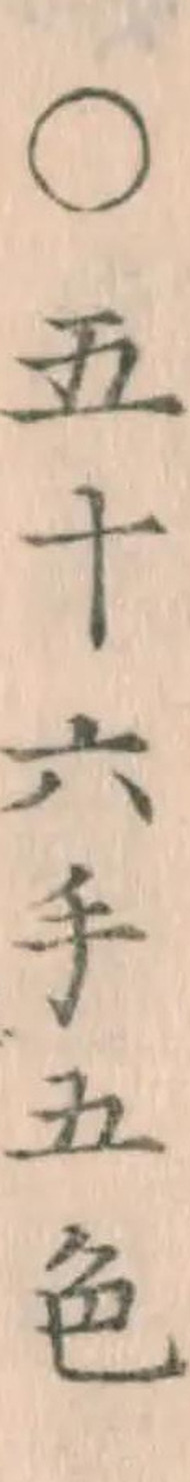○五十六手五色
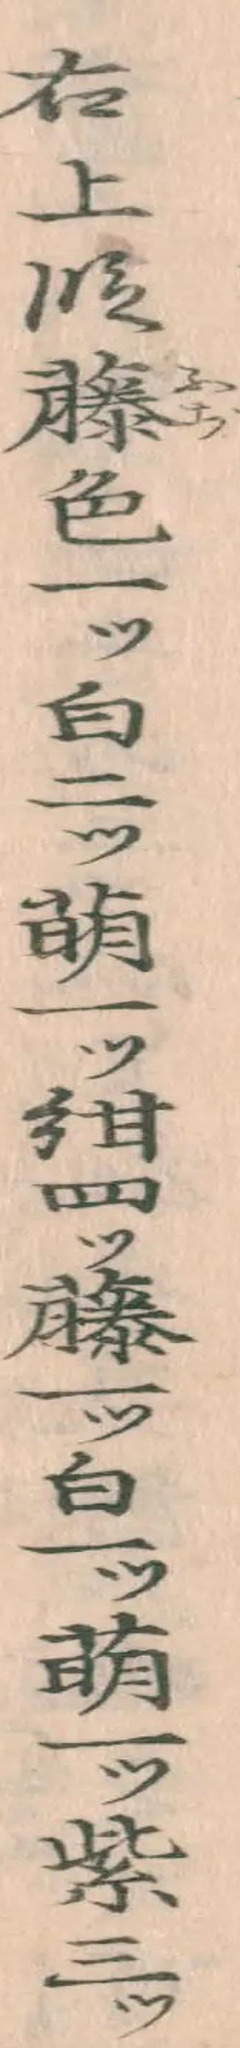右上段藤色一ッ白二ッ萌一ッ紺四ッ藤一ッ白一ッ萌一ッ紫三ッ
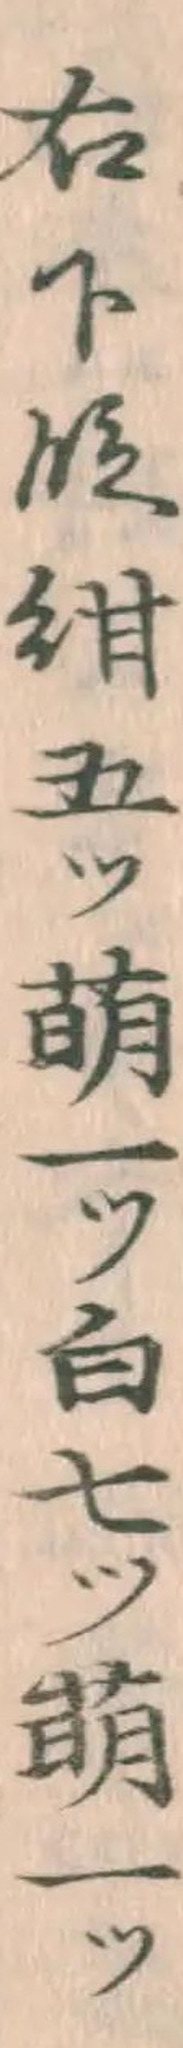右下段紺五ッ萌一ッ白七ッ萌一ッ
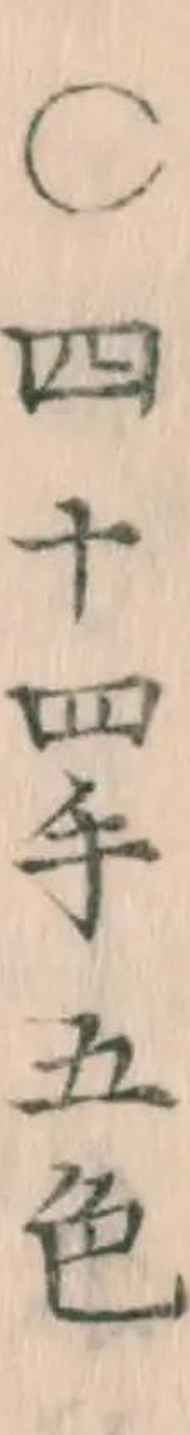○四十四手五色
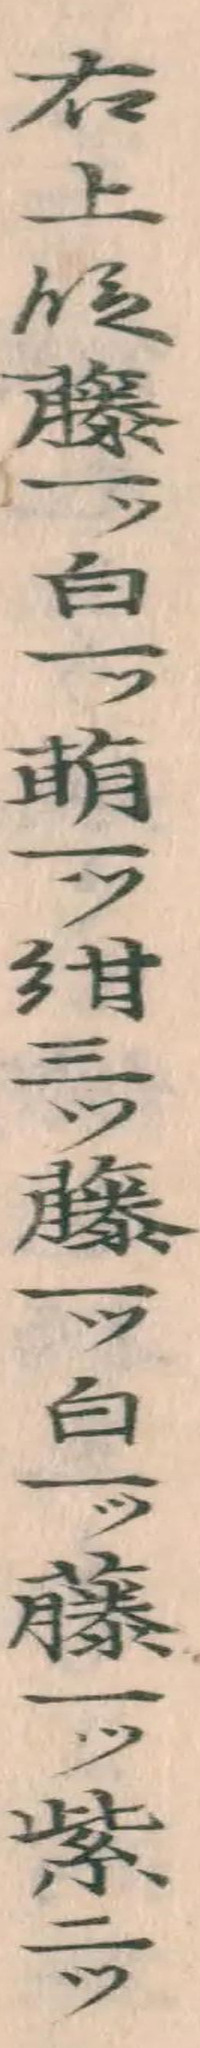右上段藤一ッ白一ッ萌一ッ紺三ッ藤一ッ白一ッ藤一ッ紫二ッ
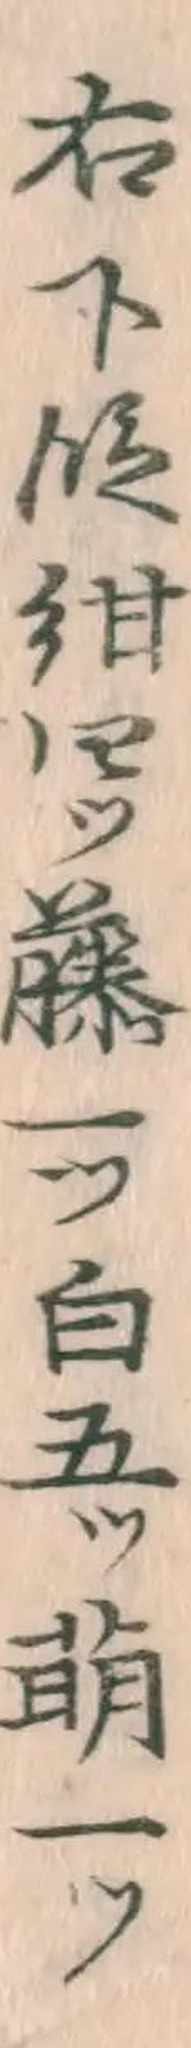右下段紺四ッ藤一ッ白五ッ萌一ッ
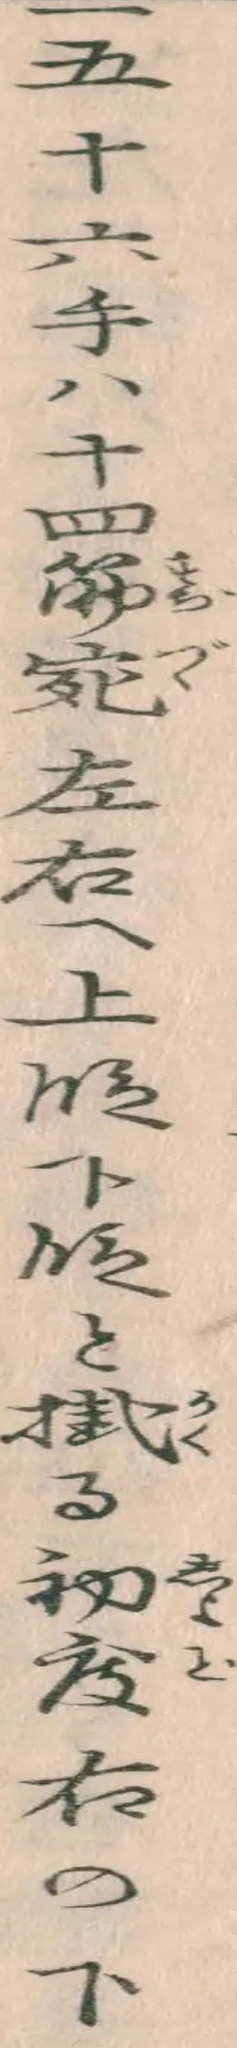一五十六手は十四筋宛左右へ上段下段と掛る初度右の下
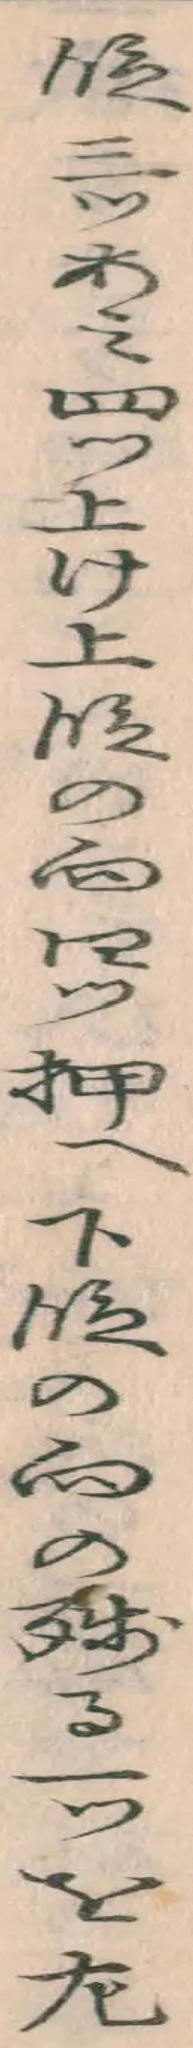段三ッあみ四ッ上け上段の向四ッ押へ下段の向の残る一ッを左
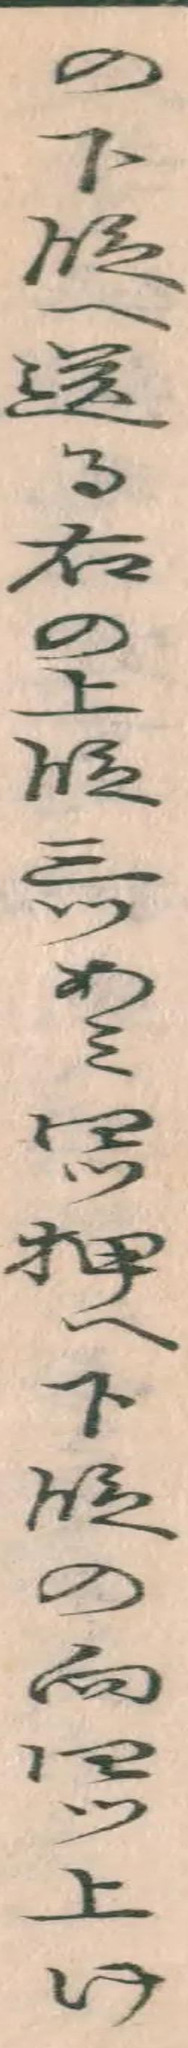の下段へ送る右の上段三ッあみ四ッ押へ下段の向四ッ上け
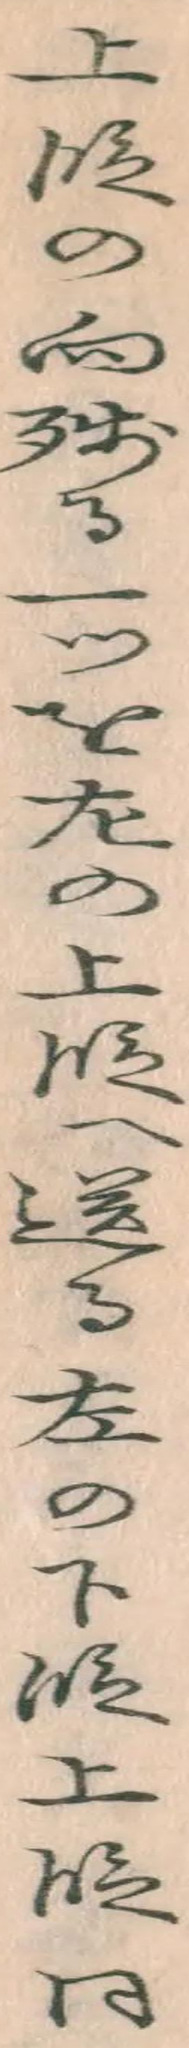上段の向残る一ッを左の上段へ送る左の下段上段同
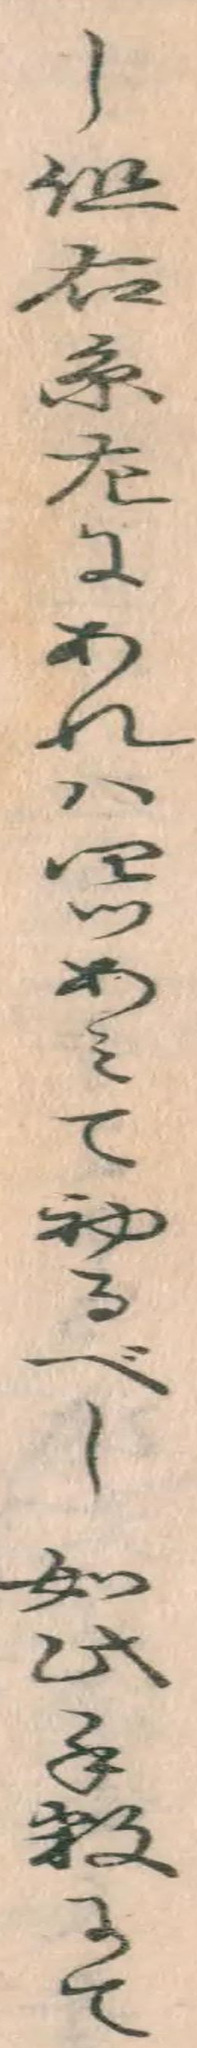し但右糸左にあれは四ッあみて初るべし如此手数にて
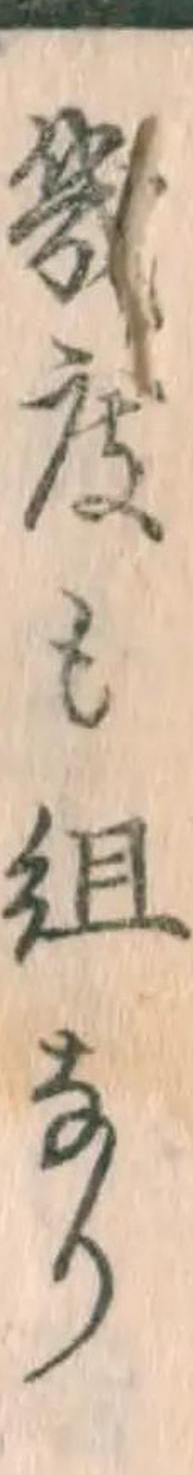幾度も組なり
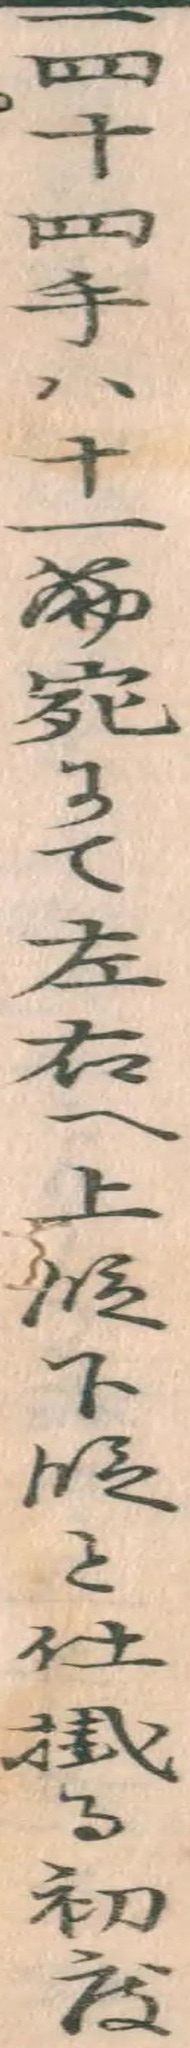一四十四手は十一筋宛にて左右へ上段下段と仕掛る初度
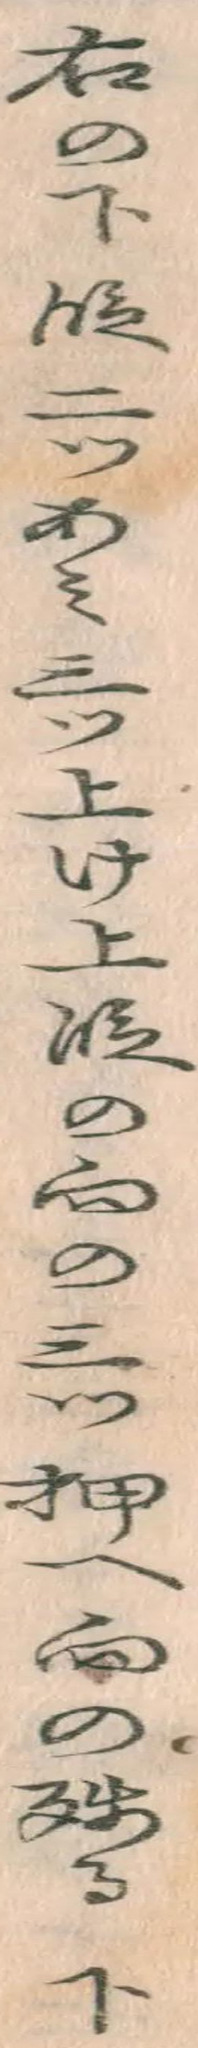右の下段二ッあみ三ッ上け上段の向の三ッ押へ向の残る下
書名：機織彙編 5巻. [2]
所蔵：国立国会図書館 National Diet Library, JAPAN
